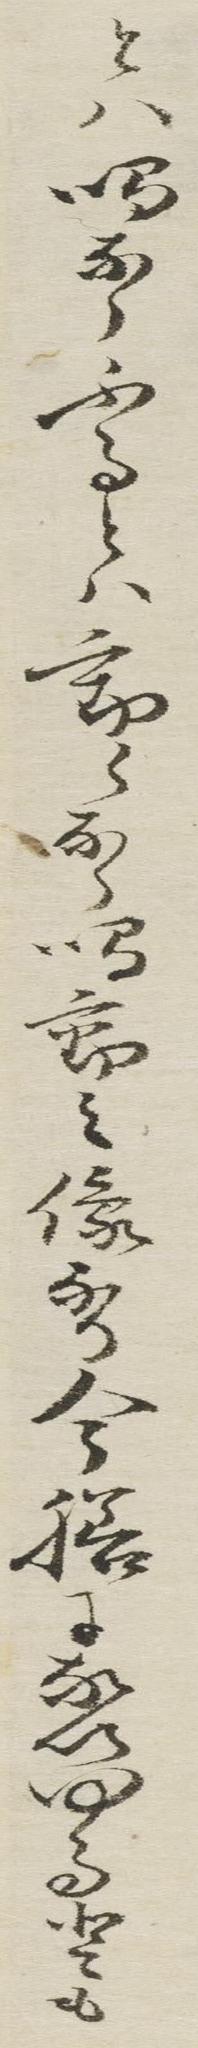とハ鳴なりふるとハ動くなり鳴動の像なり今膳にないゆるとも
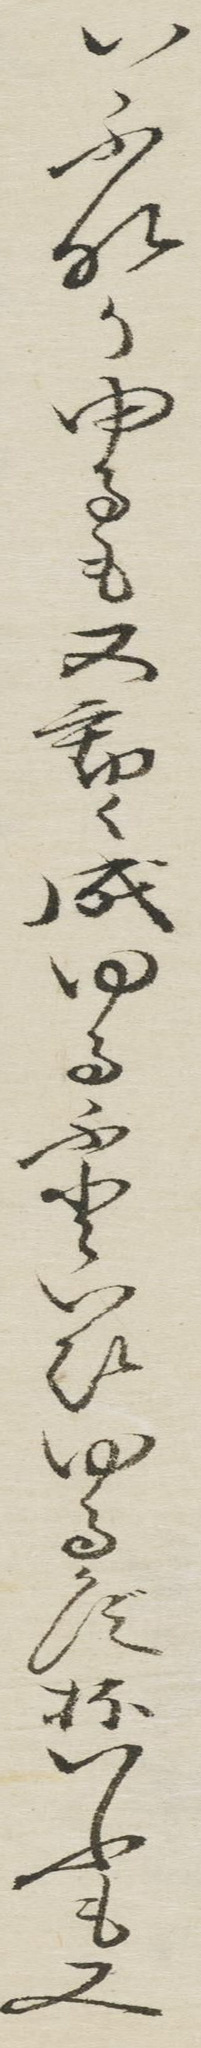いふなり申事も又動く成ゆるふといひゆるかず抔いふも又
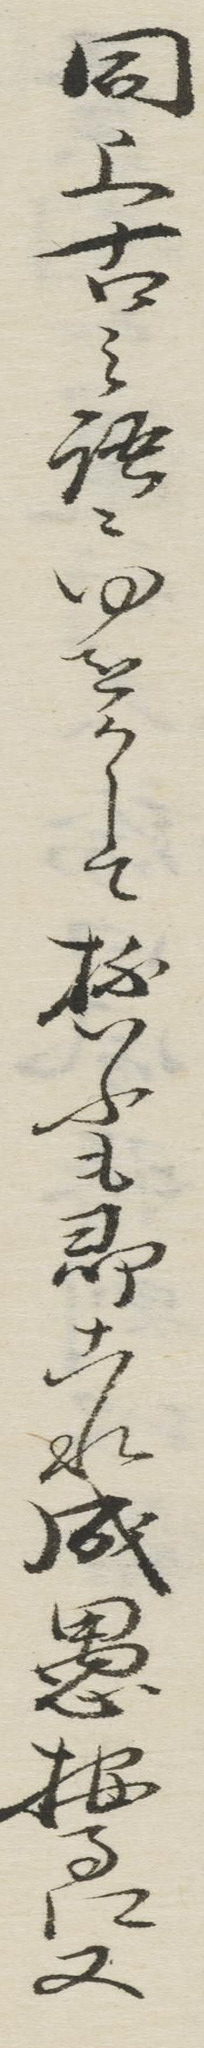同上古之語ニゆをかして抔いふも即これ成愚按るに又なつふ
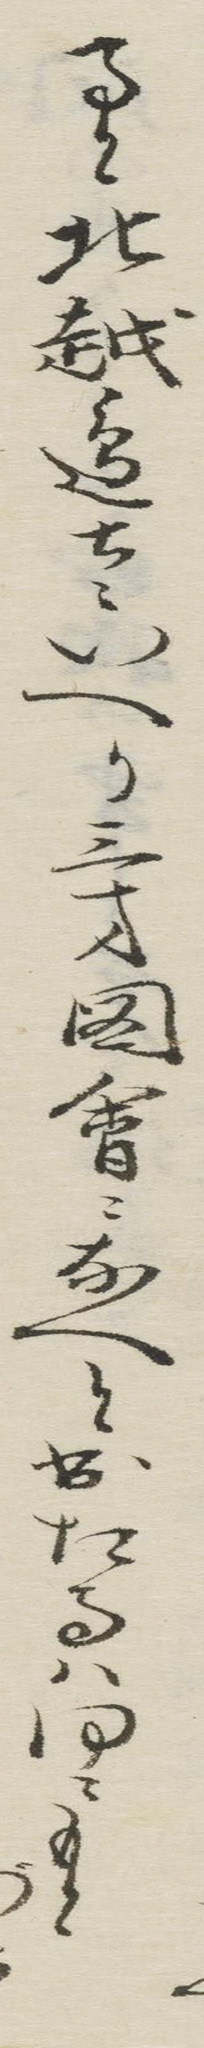ると北越辺土ニいへり三才図会ニなへと出たるハ何ニもとづける
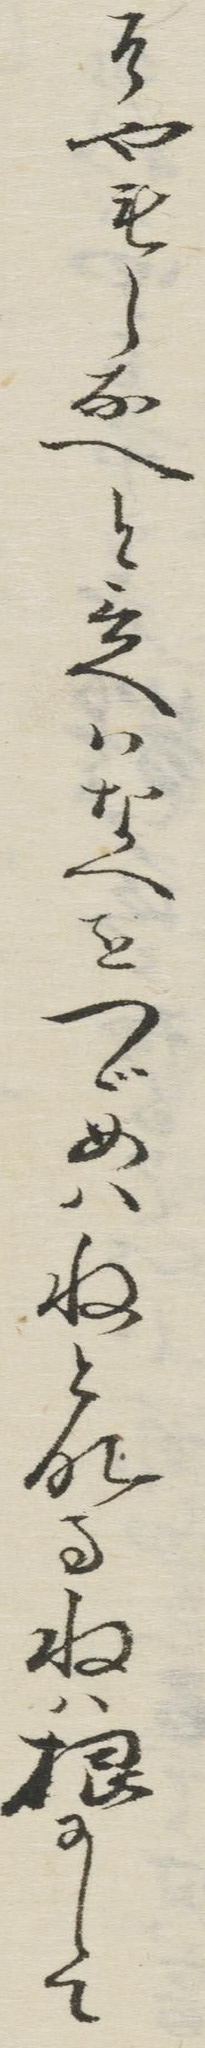にやもしなへと云人ハなへをづゞめハねとなるねハ根にして
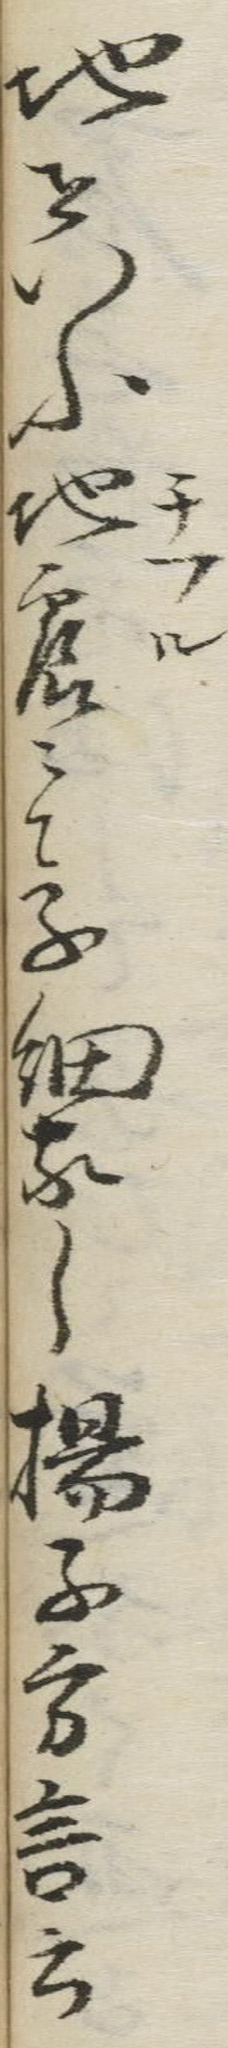地をいふ地震ニて子細なし揚子方言云
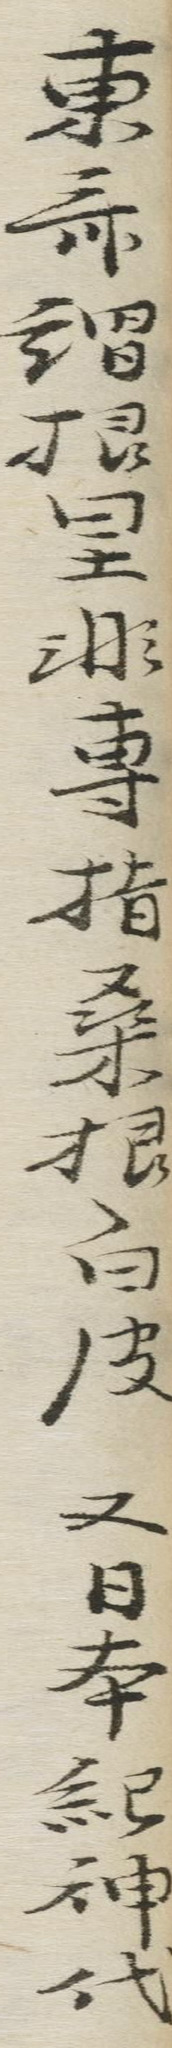東斎謂根白土非専措桑根白皮又日本紀神代
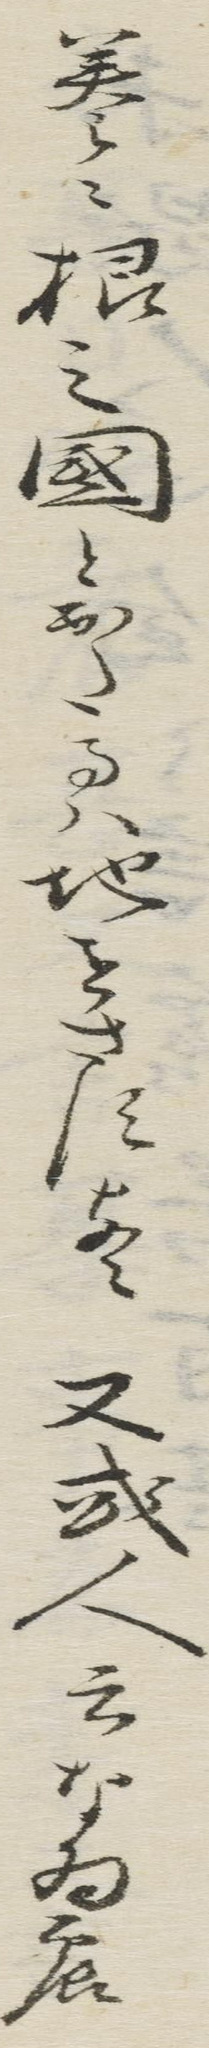養々根之国と出たる事ハ地をさす歟又或人云なゐ震
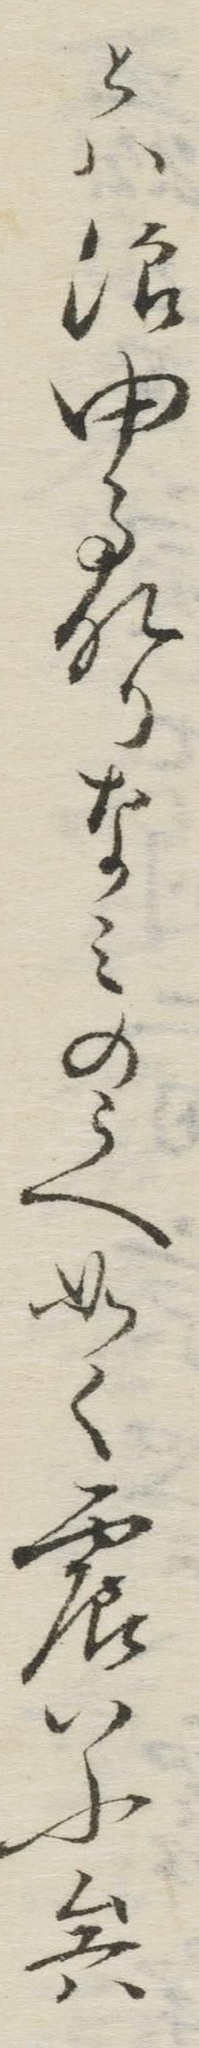トハ浪ゆるなりなミのうへ如く震いふ矣
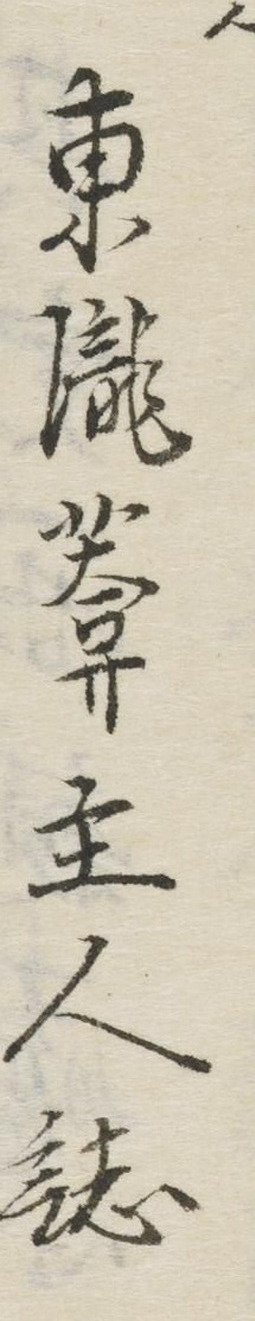東瀧莾主人誌
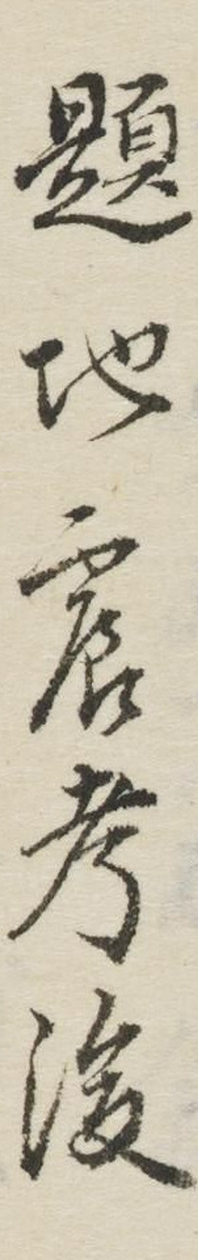題地震考浚
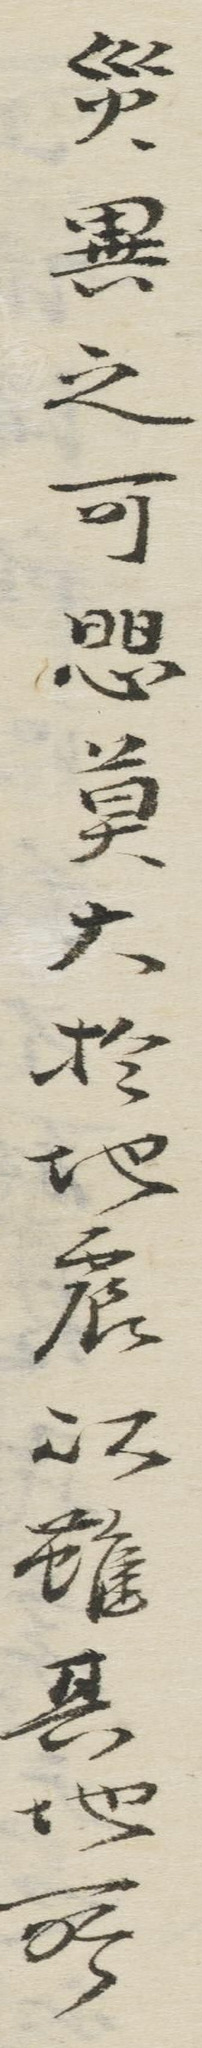災異之可思莫大於地震以雖其地所

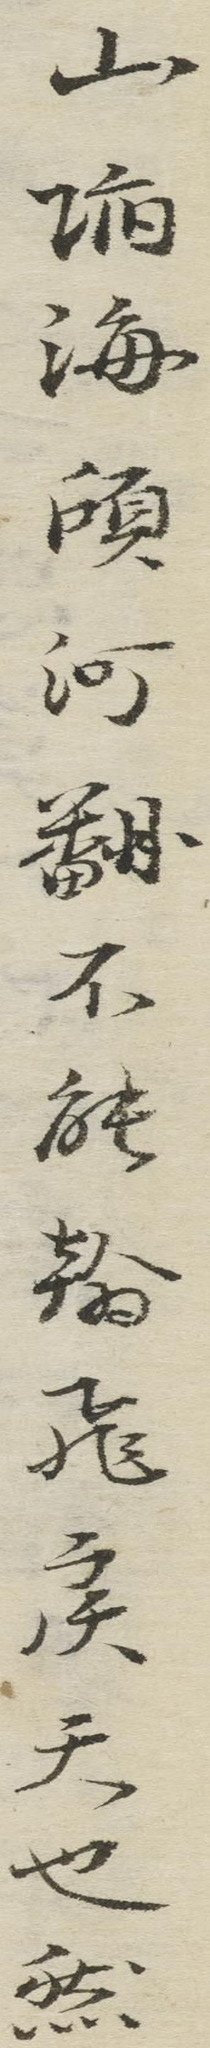山陥海傾河翻不能翰飛戻天也然
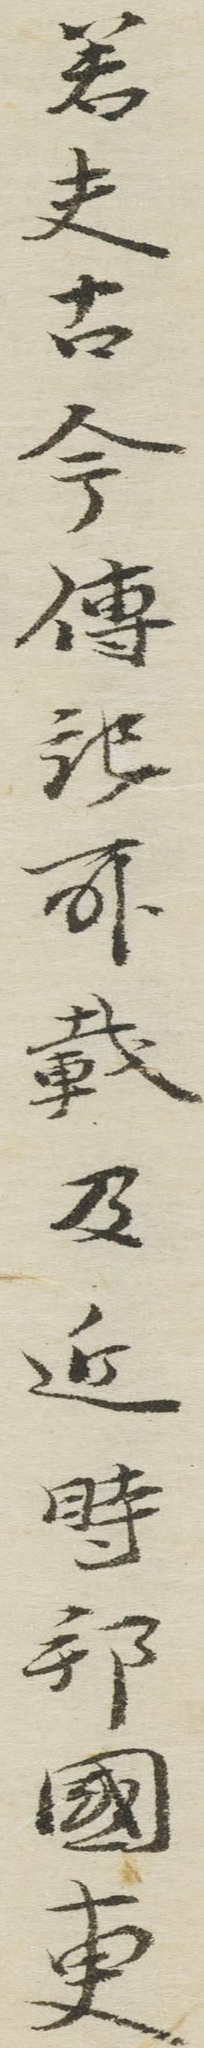若夫古今伝記所載及近時邦国更
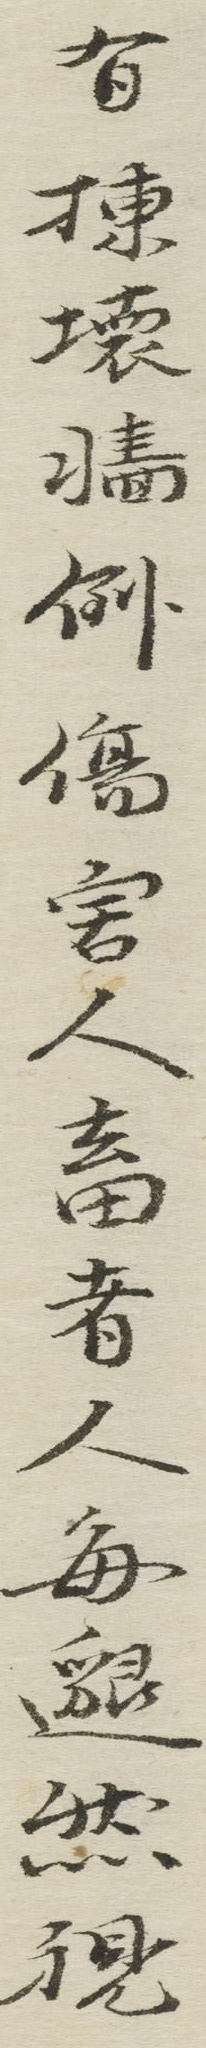有棟壊情倒傷害人畜者人毎懇然視
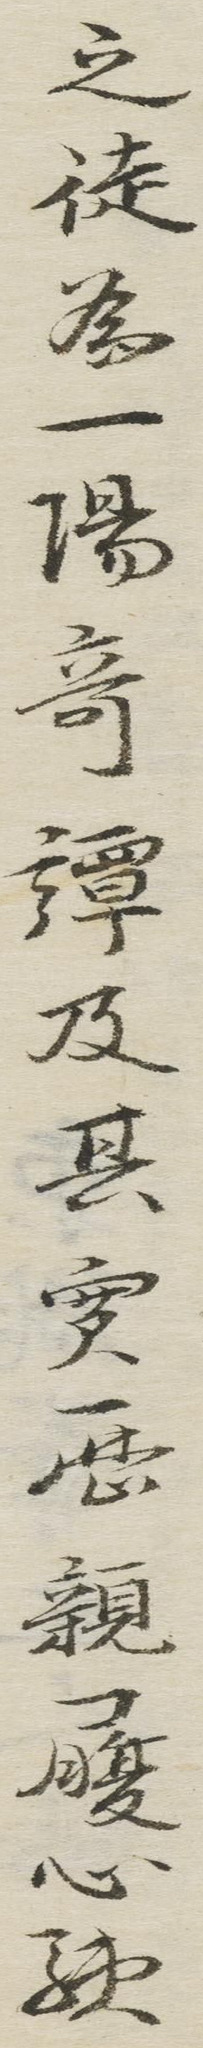之徒為一陽奇譚及其実歴親履心歟
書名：諸国大地震大津波一代記
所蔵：東京大学地震研究所図書室 Earthquake Research Institute Library, The University of Tokyo, JAPAN
